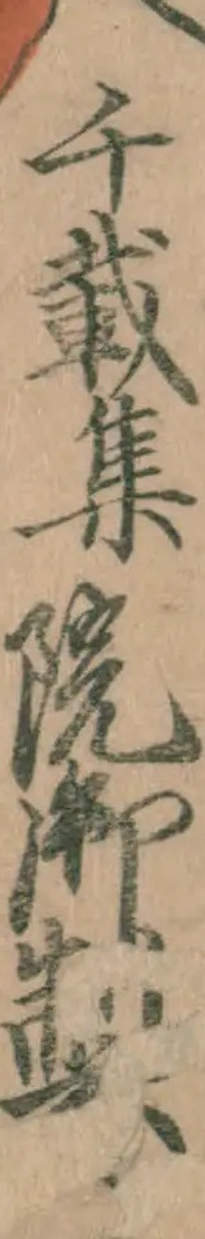千載集院御製
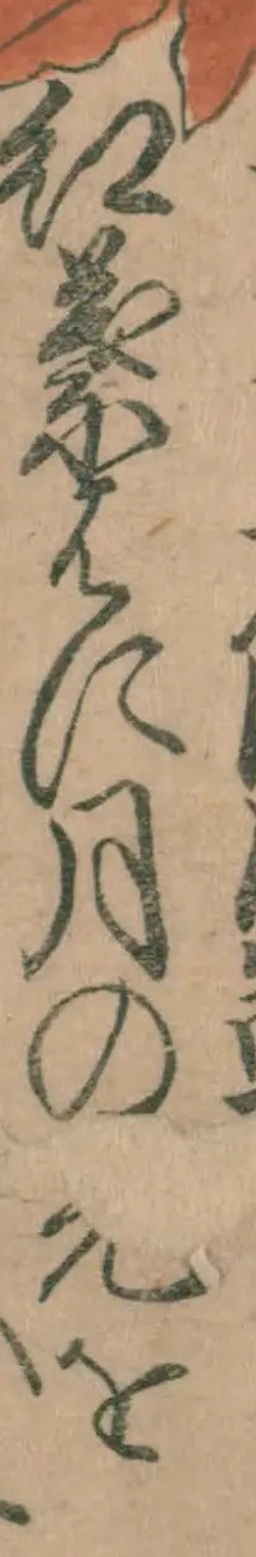紅葉はに月の光を
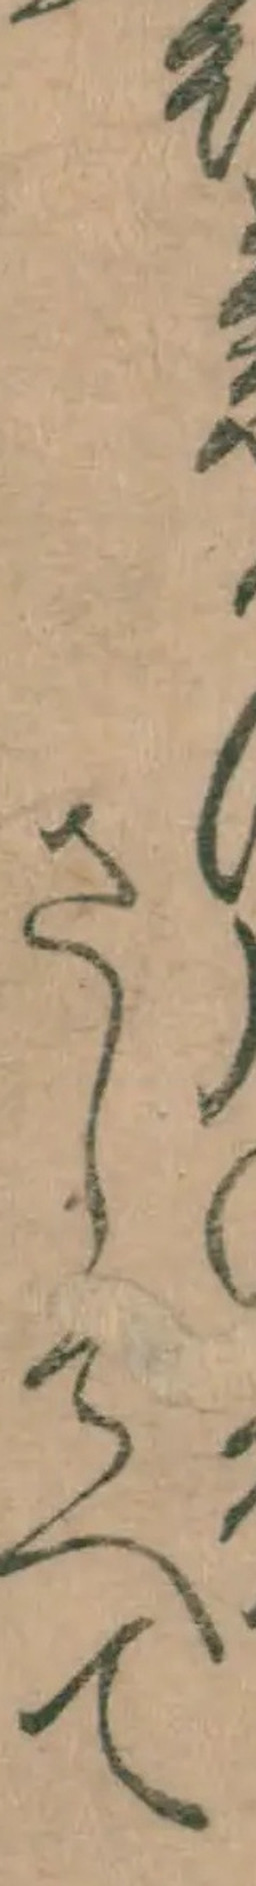さしそへて
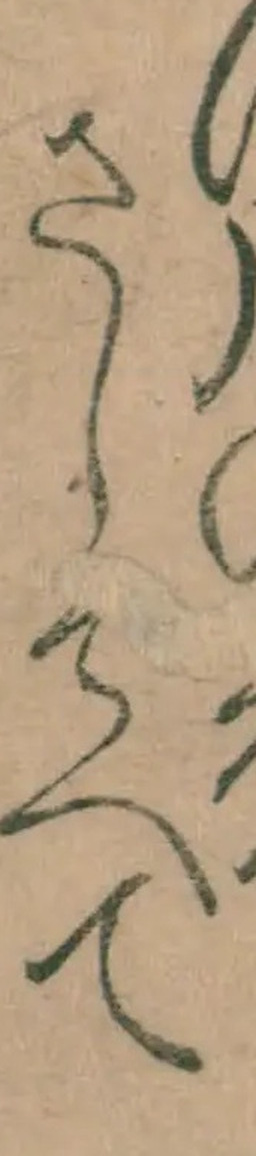さしそへて
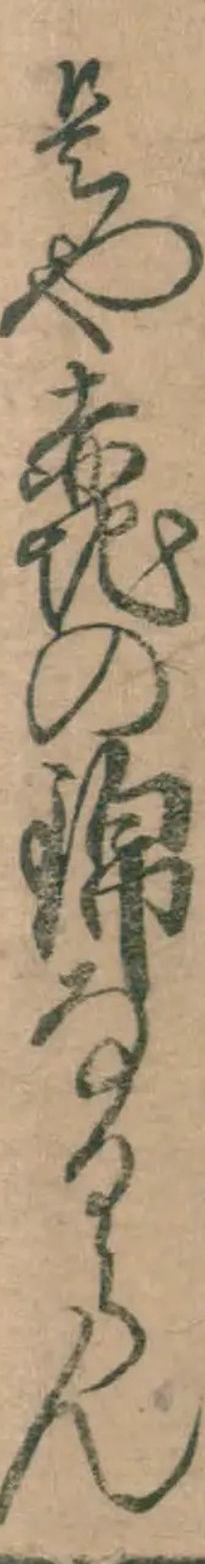是や赤地の錦なるらん
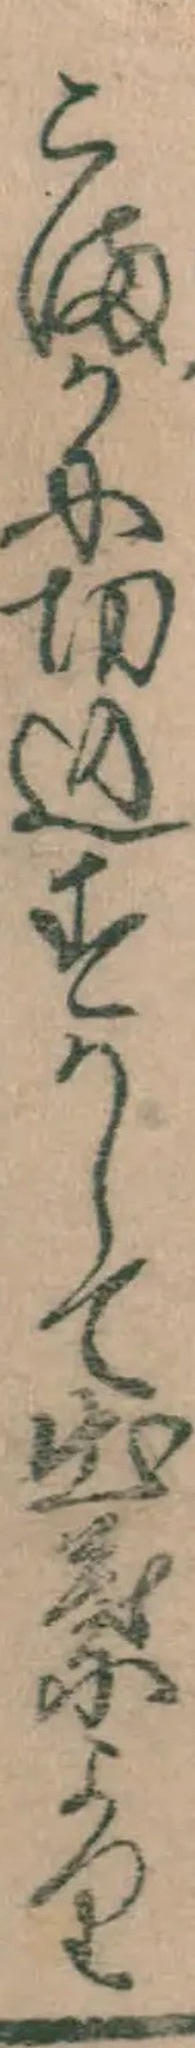こまかに切込すかして出葉より
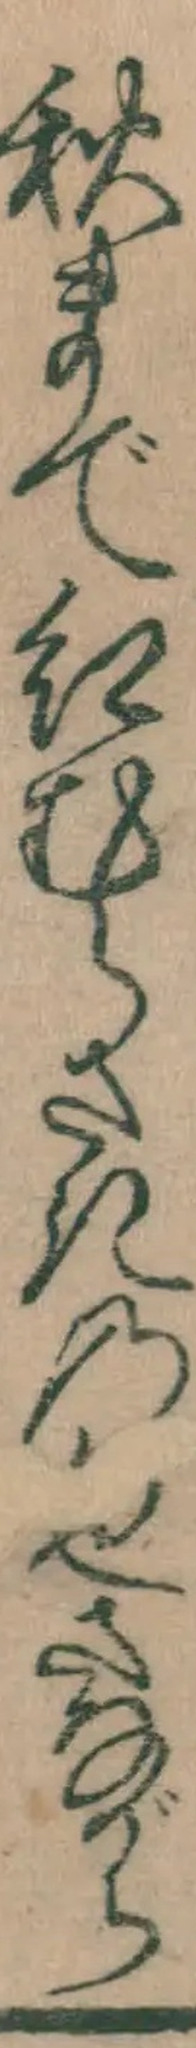秋まで紅むらさきの色さながら
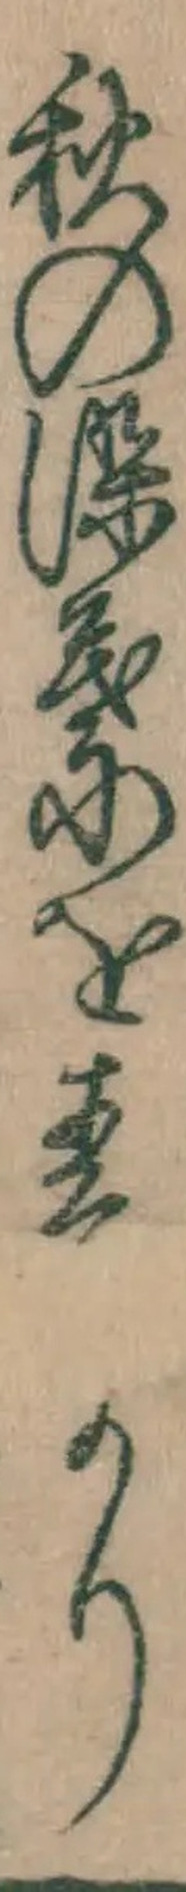秋の染葉を春より
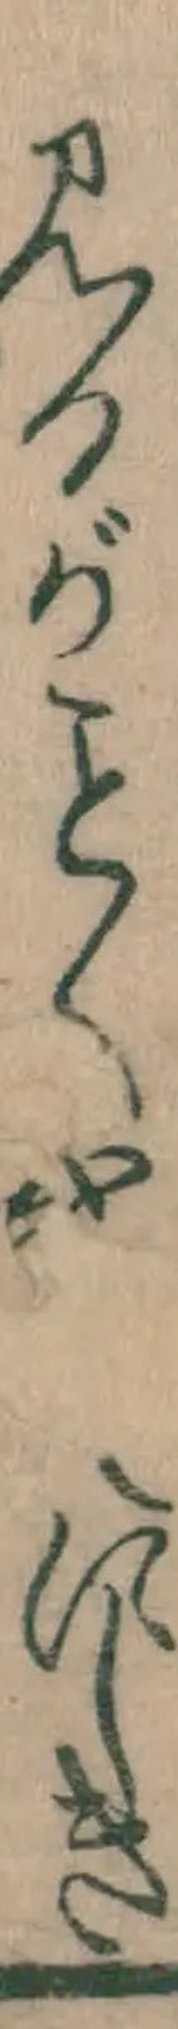見るがごとくとてにしき
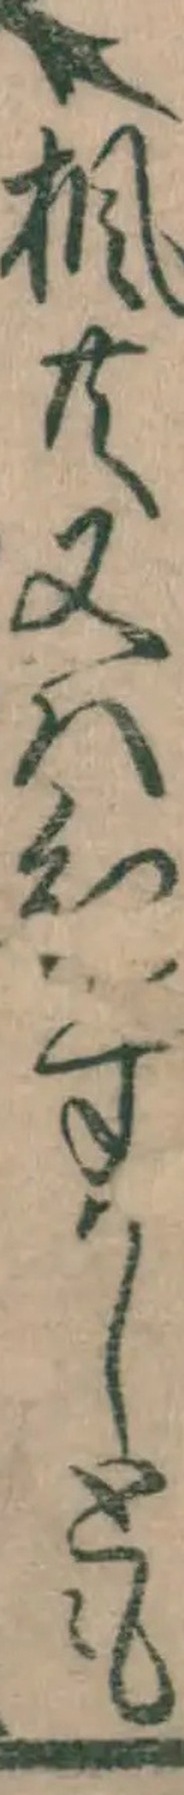楓共又は紅すかしとも
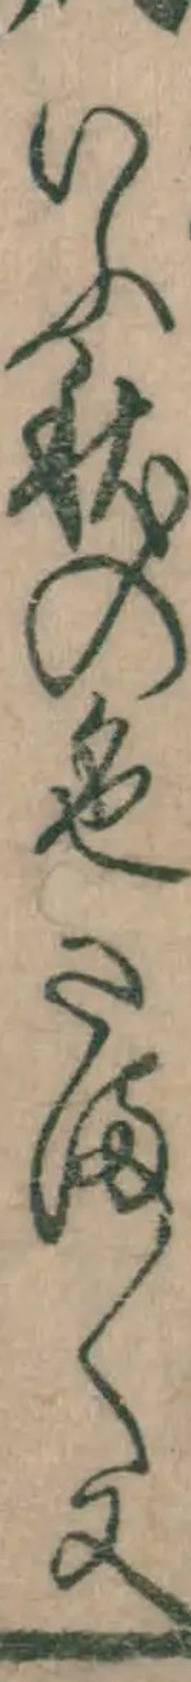いふ秋の色さま〳〵又
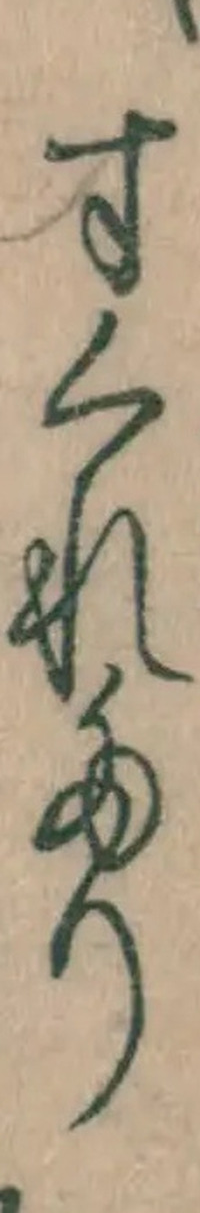すくれたり
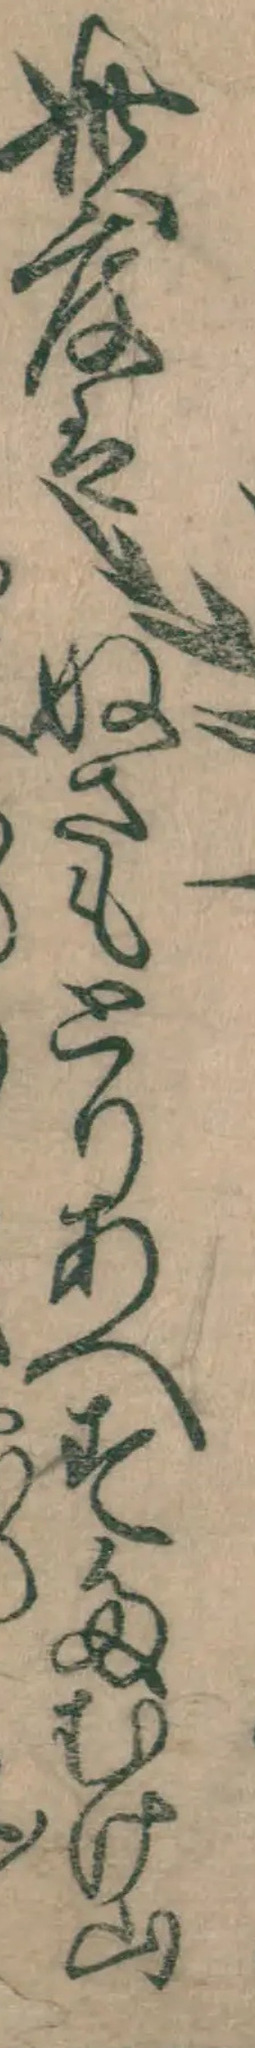此度はぬさもとりあへすたむけ山
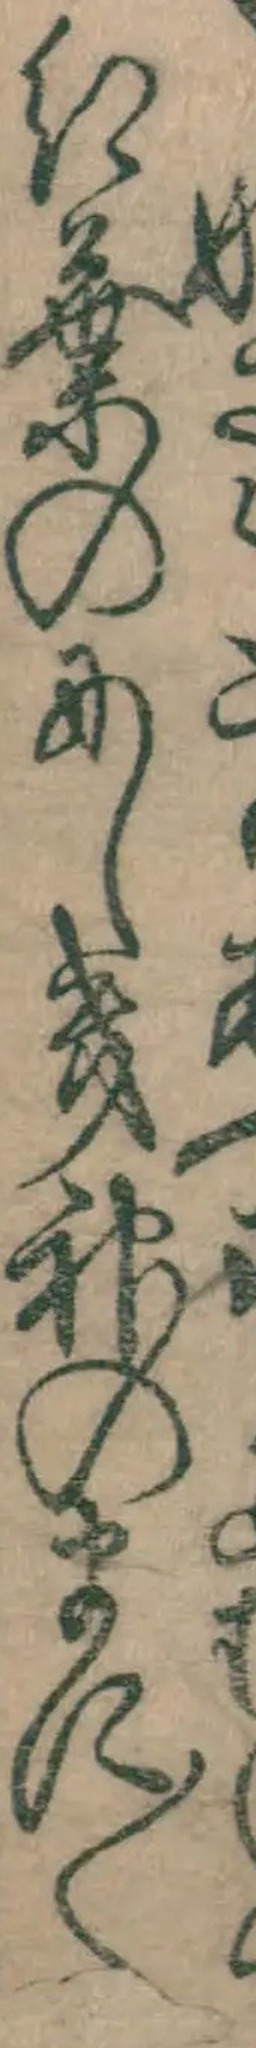紅葉のにしき神のまに〳〵

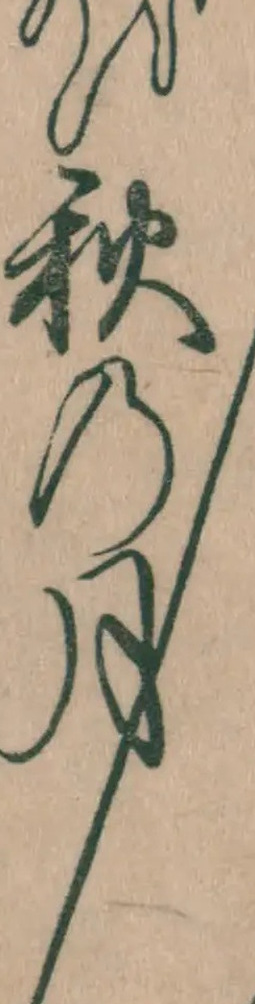秋の月
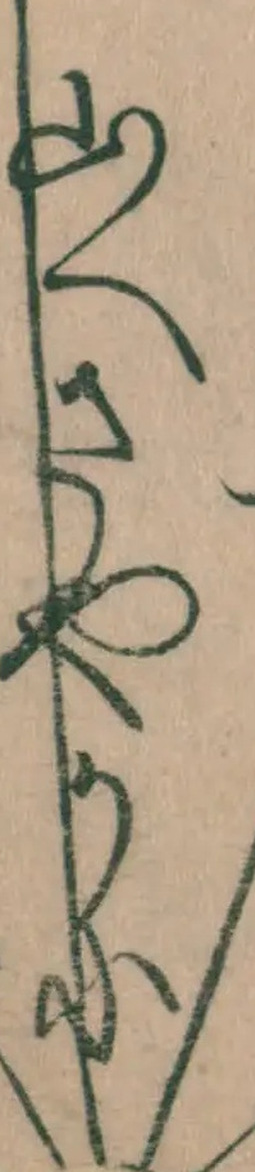山へさやかに
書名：紅葉集
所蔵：国立国会図書館 National Diet Library, JAPAN
